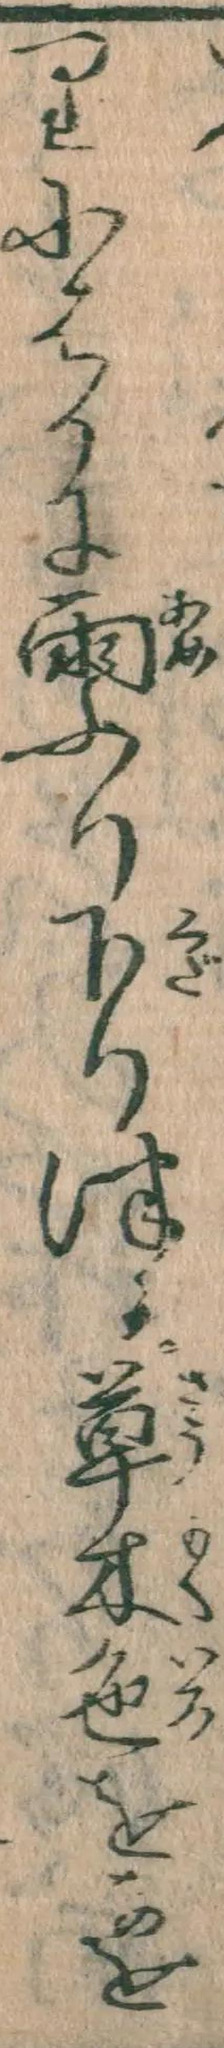りにはかに雨ふり下りつ。草木色をなを
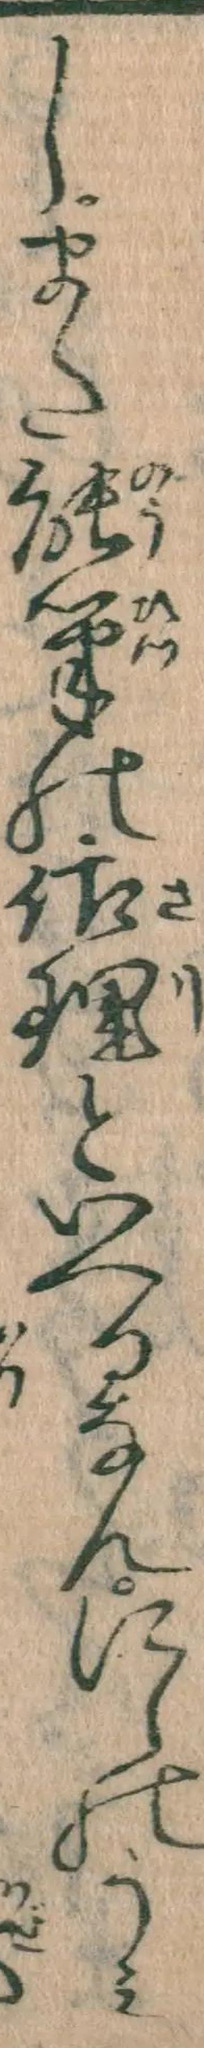し。また能筆の佐理といへるなん。にしのうみ
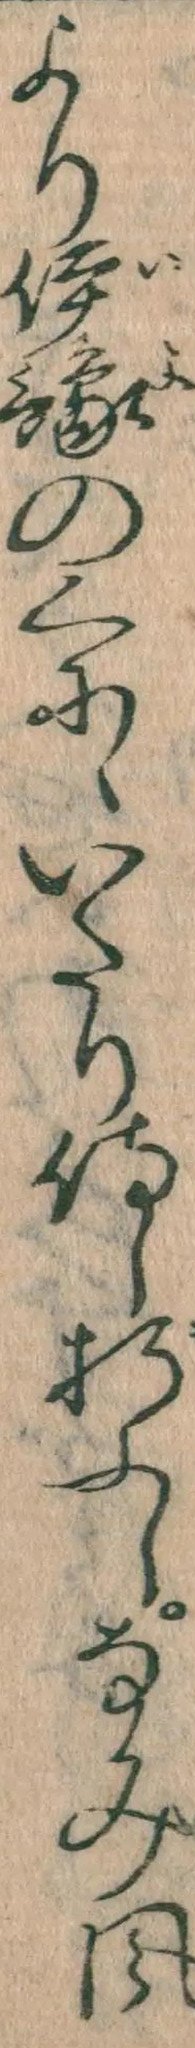より伊予のくにゝいたり侍し折ふし。なみ風
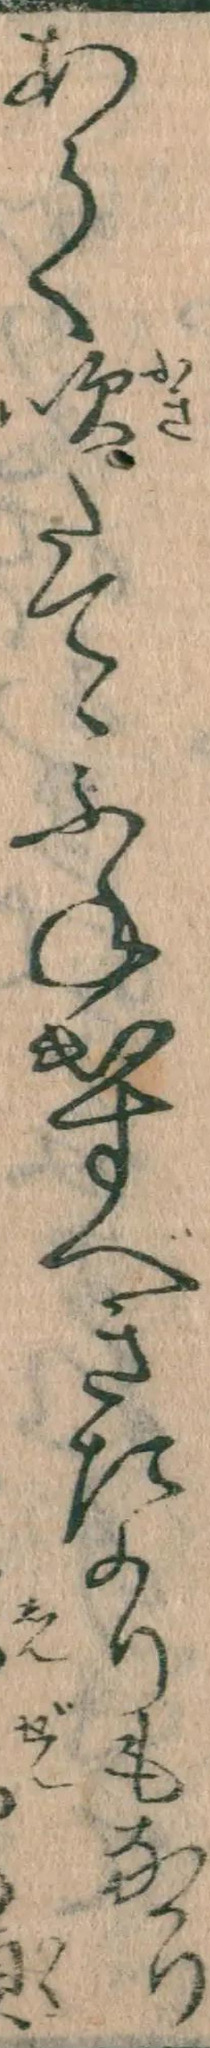あらく吹。たてゝふね出すべきたよりもなかり
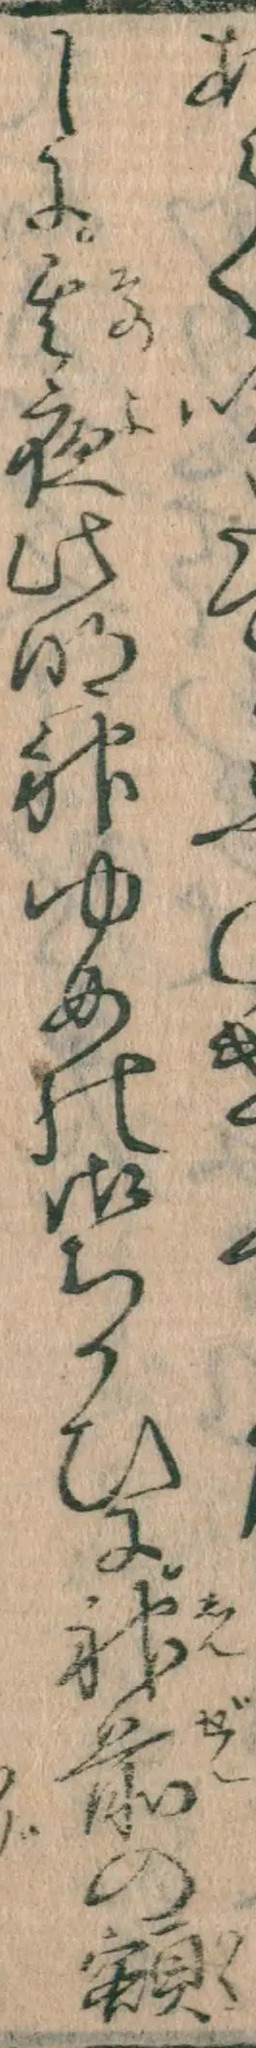しに。其夜此明神ゆめの御ちかひに。神前の額
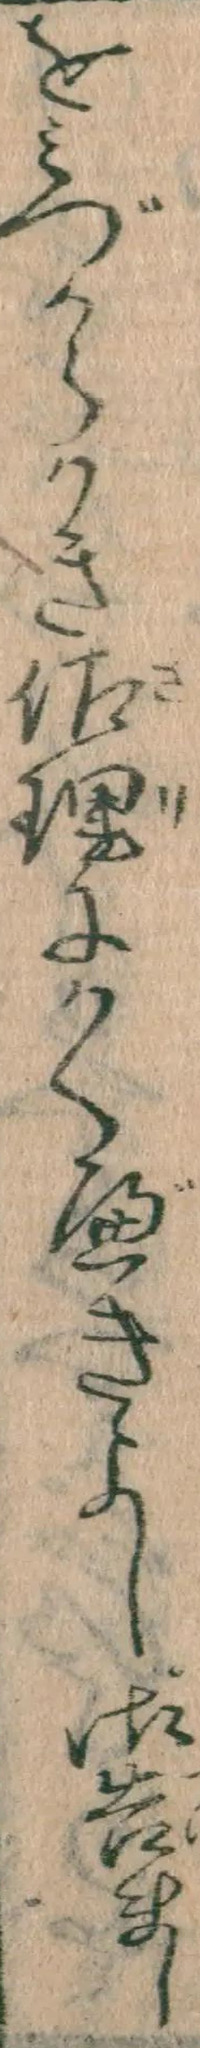をみづからかき佐理にかくべきよし。御告まし
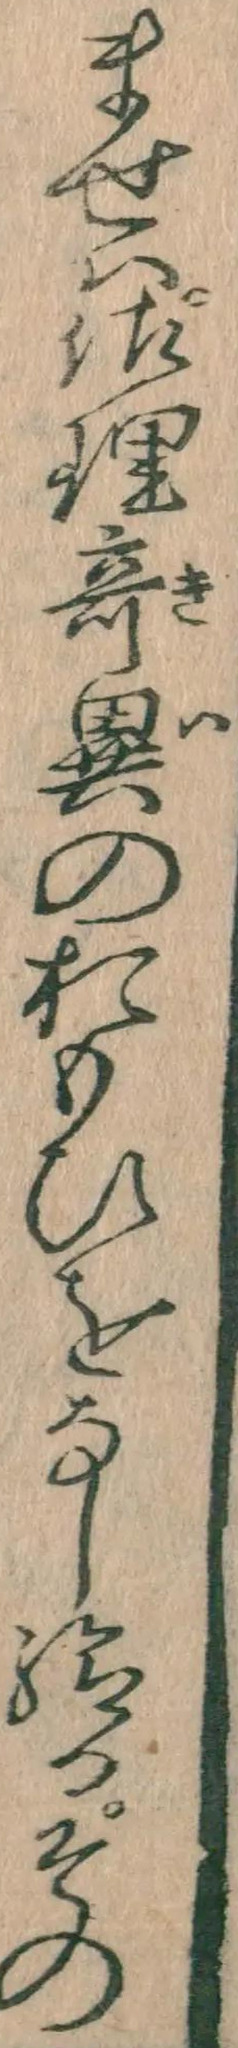ませは。佐理奇異のおもひをなし給ひ。その
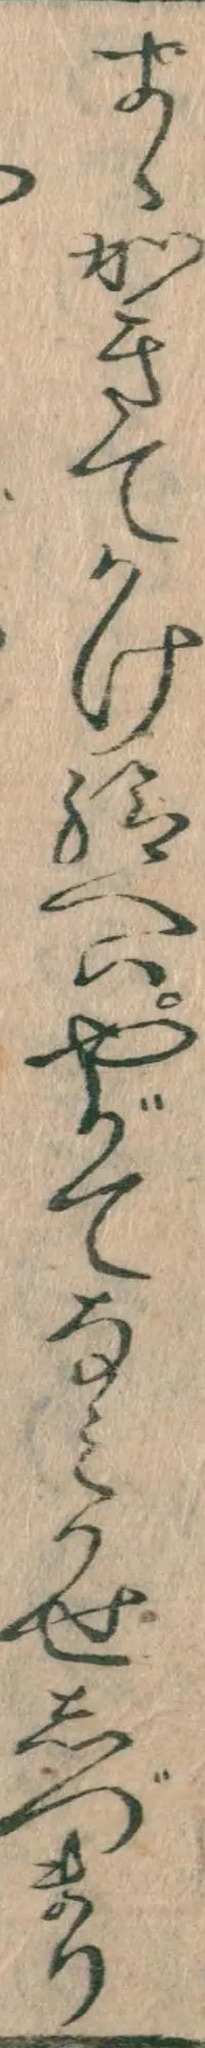まゝかきてかけ給へは。やがてなみかぜしづまり
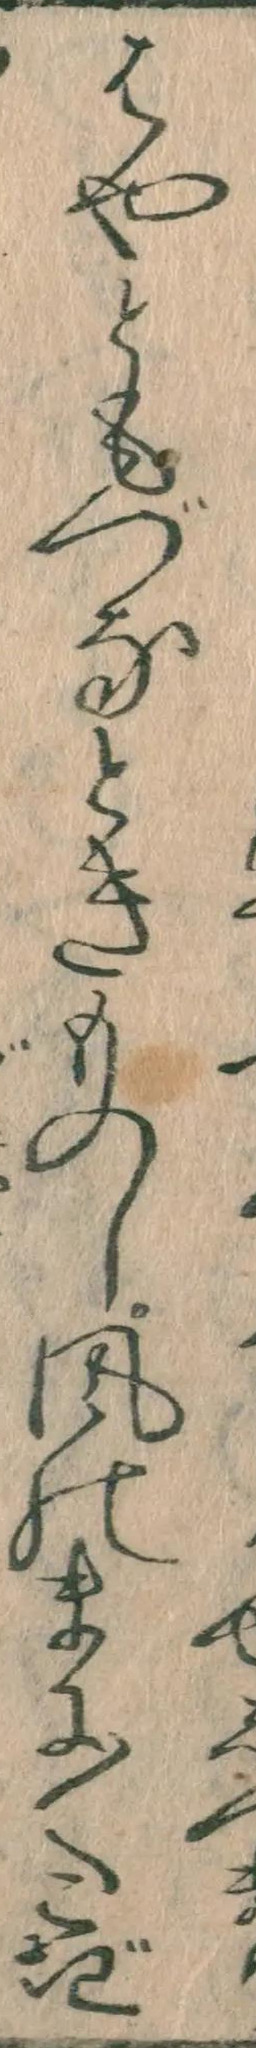はやともづなときものし。風のまに〳〵こぎ
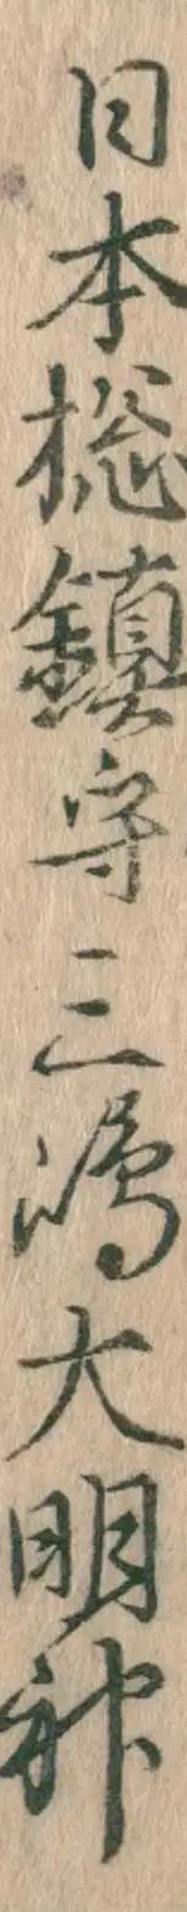日本総鎮守三島大明神
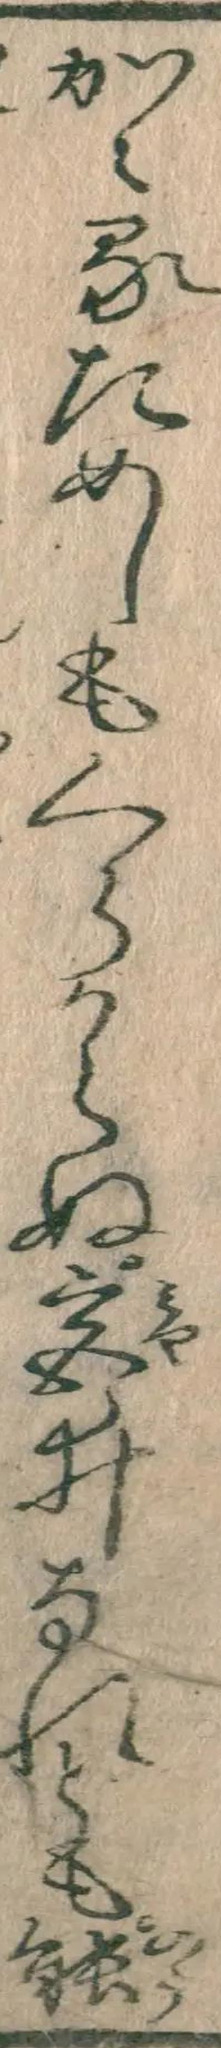かゝるためしもくらからぬ。宮井なれとも。能
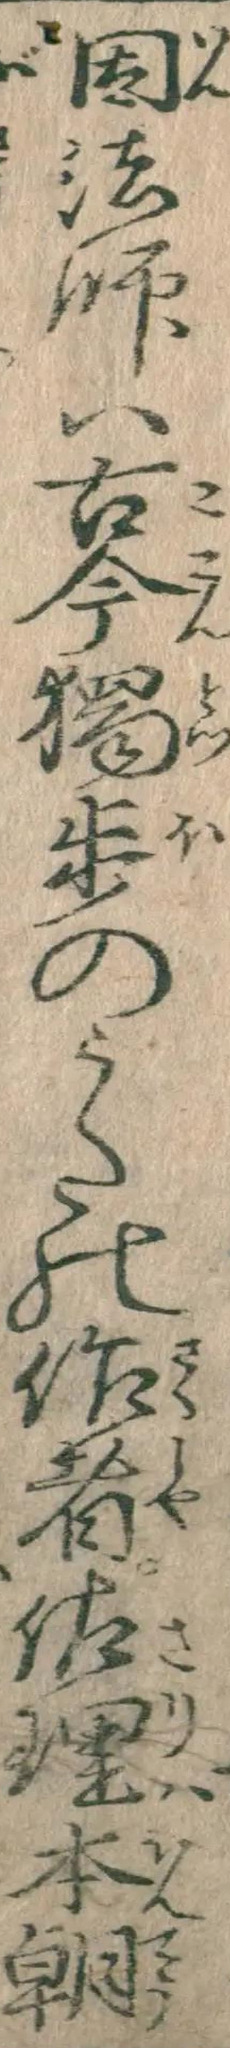因法師は古今独歩のうたの作者。佐理本朝
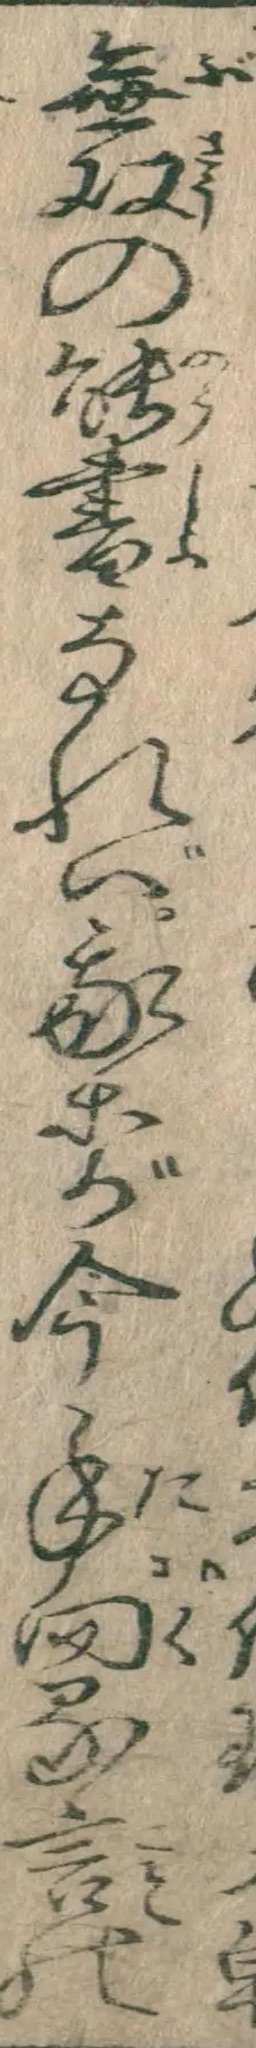無双の能書なれば。我等が今手向る言の
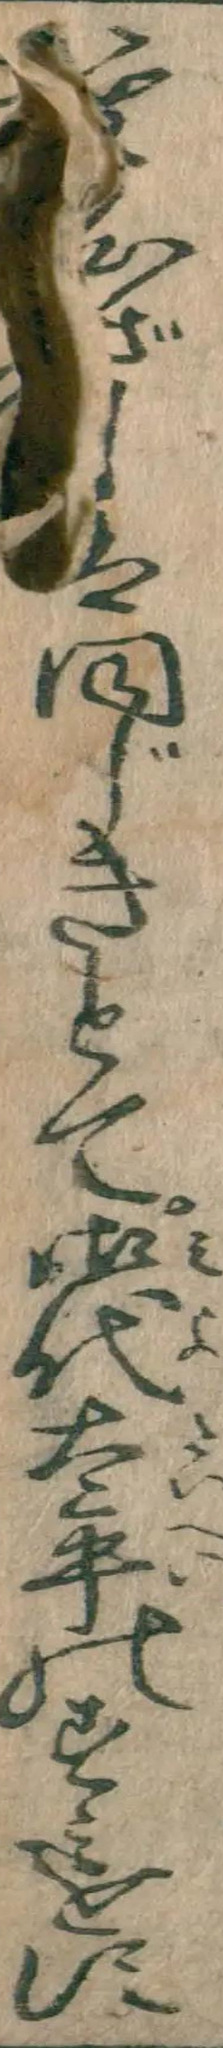其心ざしは同じきとて。御代太平のすみをす

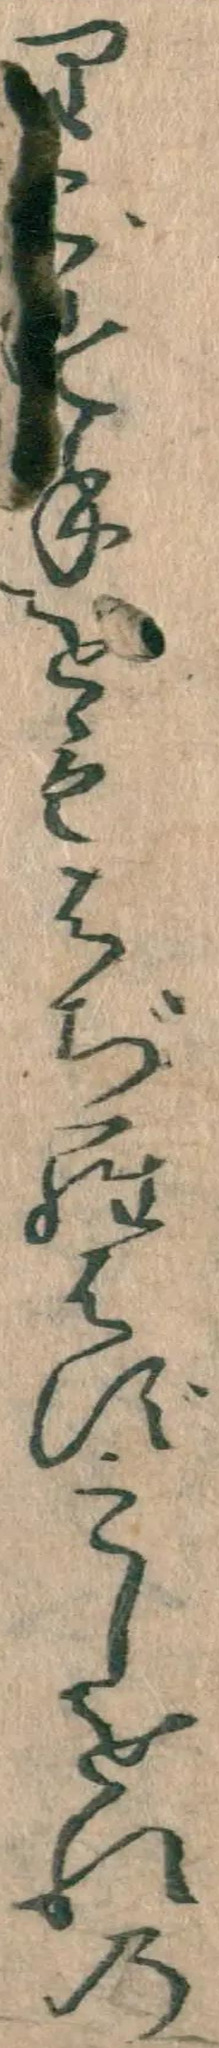り手をもはぢらはずこしをれの
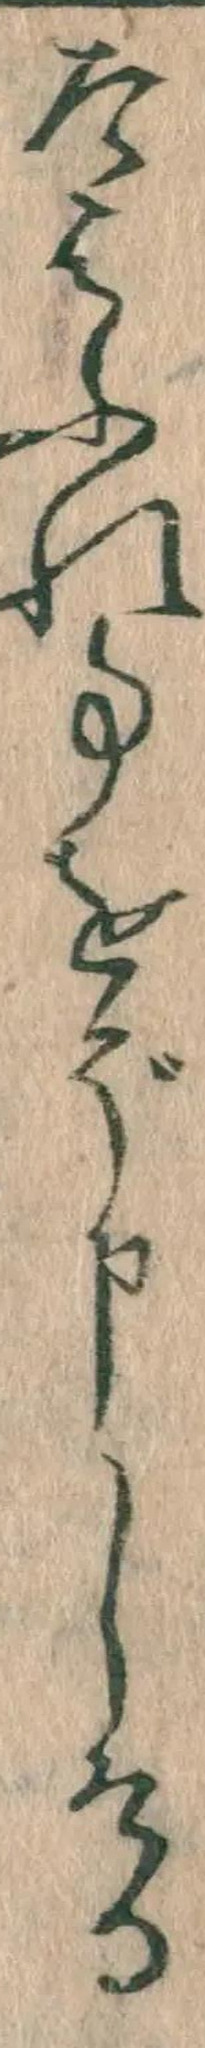たはふれ事をぞ申しける
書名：竹斎狂歌物語 3巻
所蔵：国立国会図書館 National Diet Library, JAPAN
